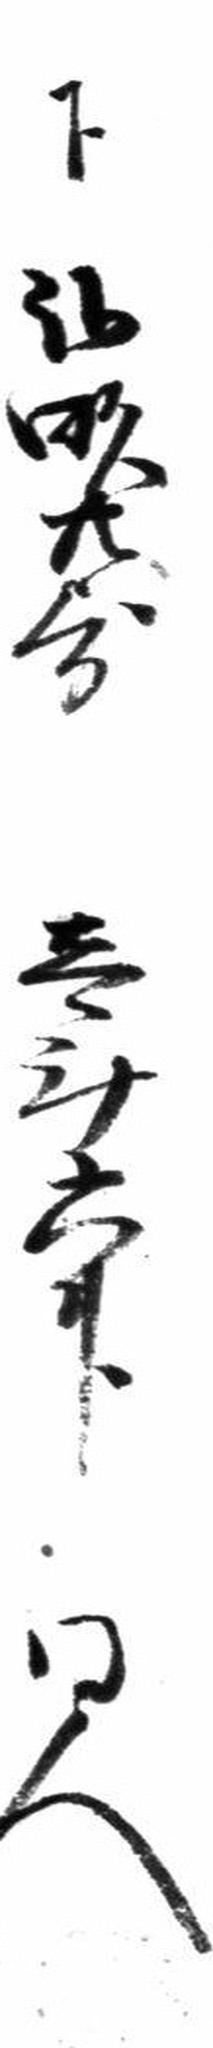下弐畝廿歩壱斗六升同人
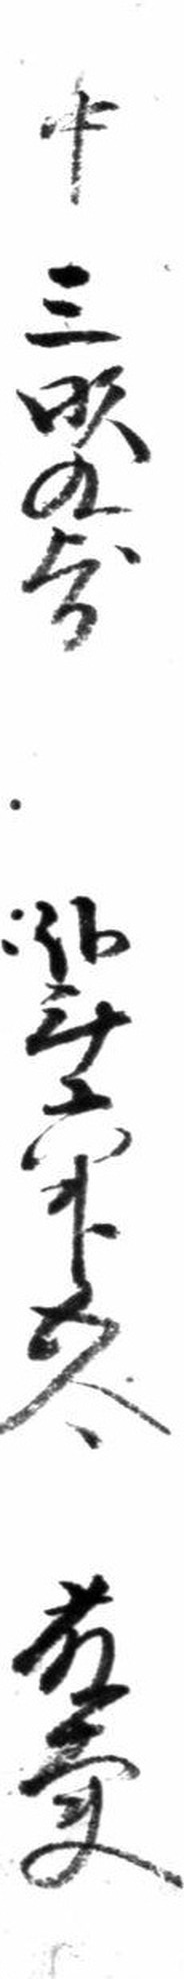中三畝九歩弐斗六升五合藤大夫

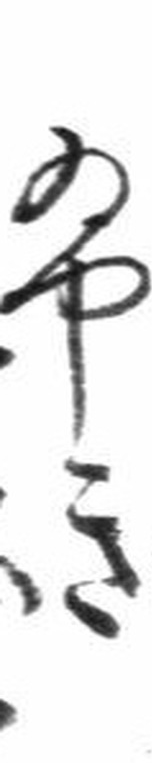ゐやしき
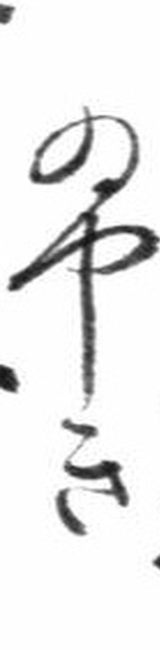ゐやしき
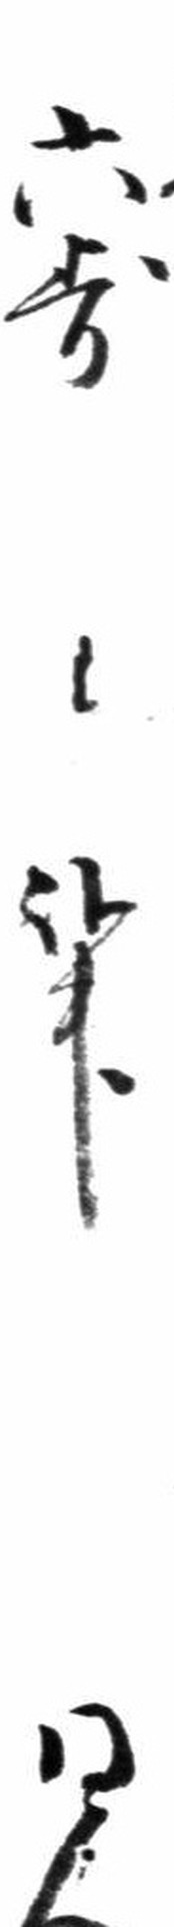六歩弐升同人
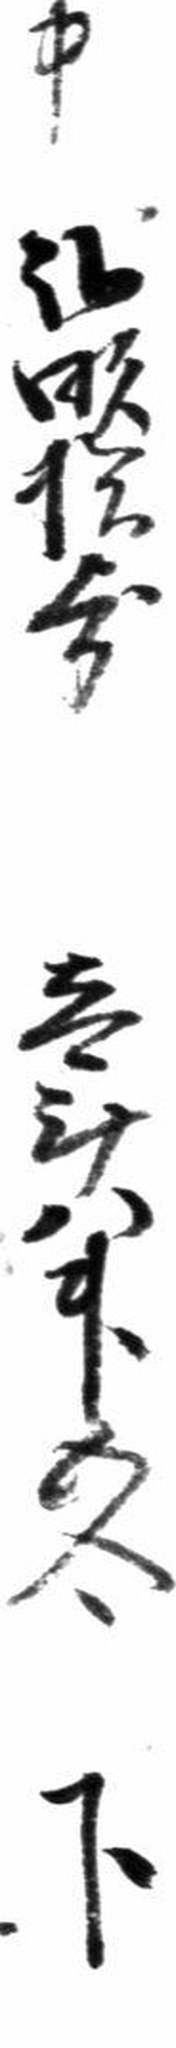中弐畝拾歩壱斗八升五合下
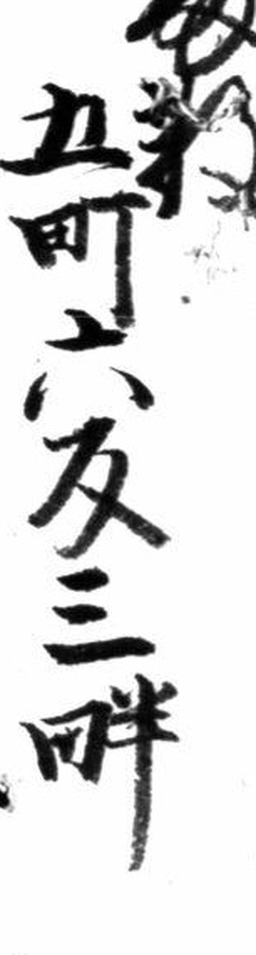五町六反三畔
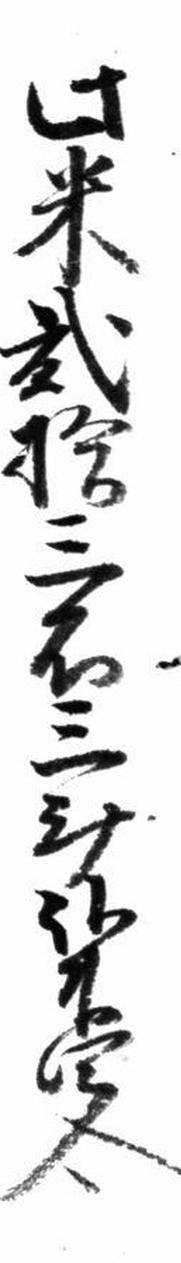此米弐拾三石三斗弐升四合
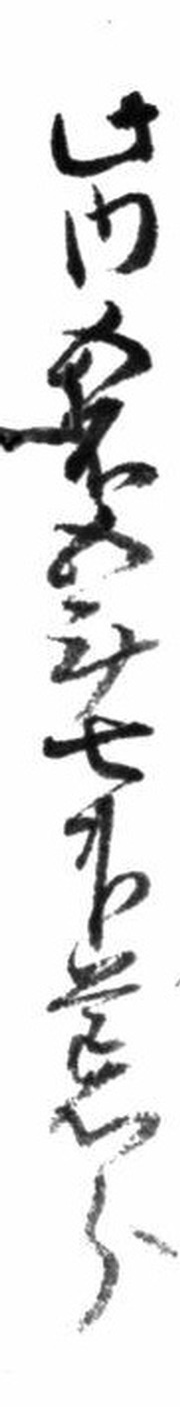此内五石五斗七升荒分
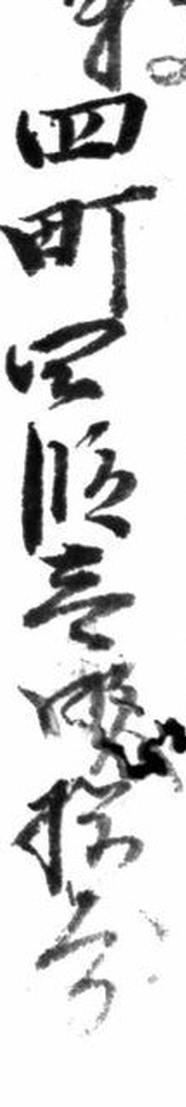四町四段壱畝拾歩
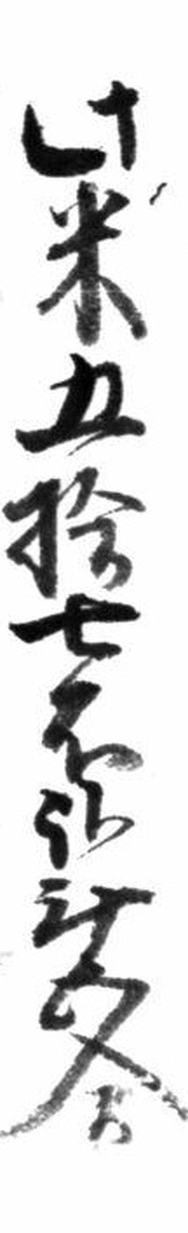此米五拾七石弐斗五合
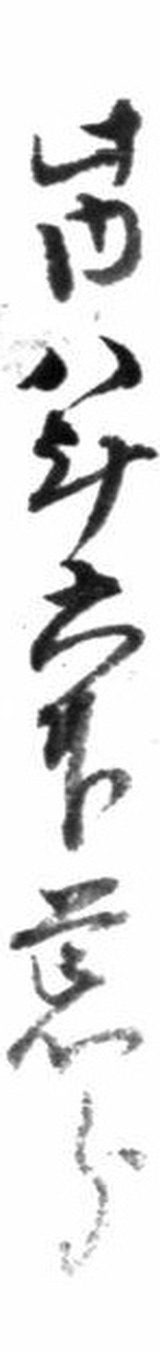此内八斗六升荒分

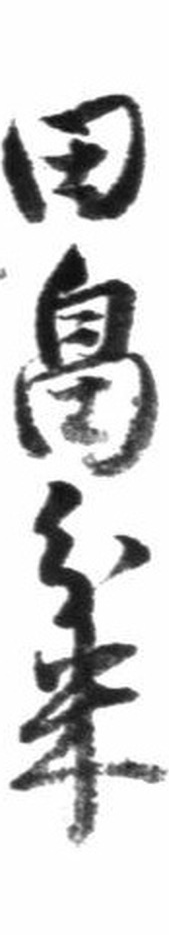田畠分米
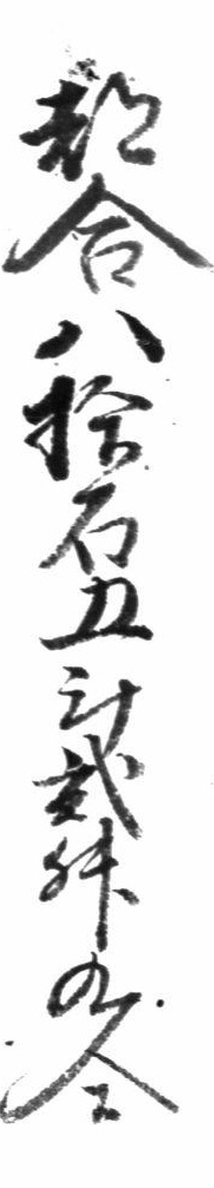都合八拾石五斗弐升九合
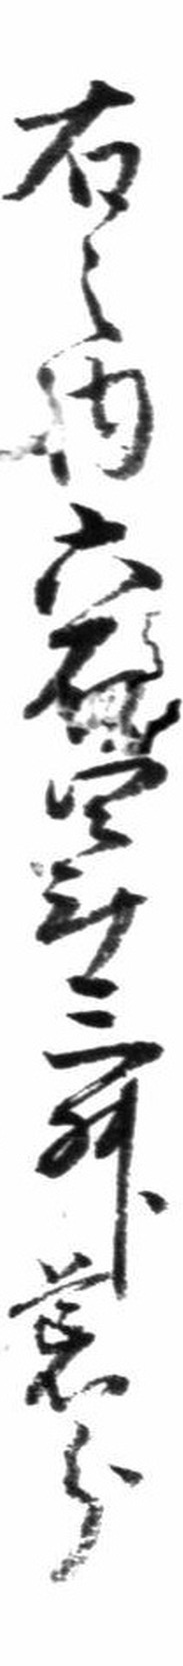右之内六石四斗三升荒分
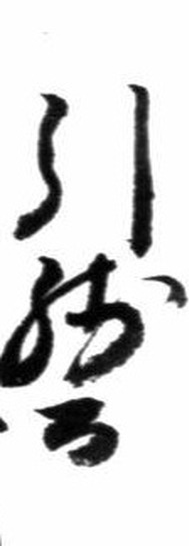引残而
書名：若州三方郡之内世久見浦御検地帳（世久見浦検地帳写）
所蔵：福井県文書館 Fukui Prefectural Archives
